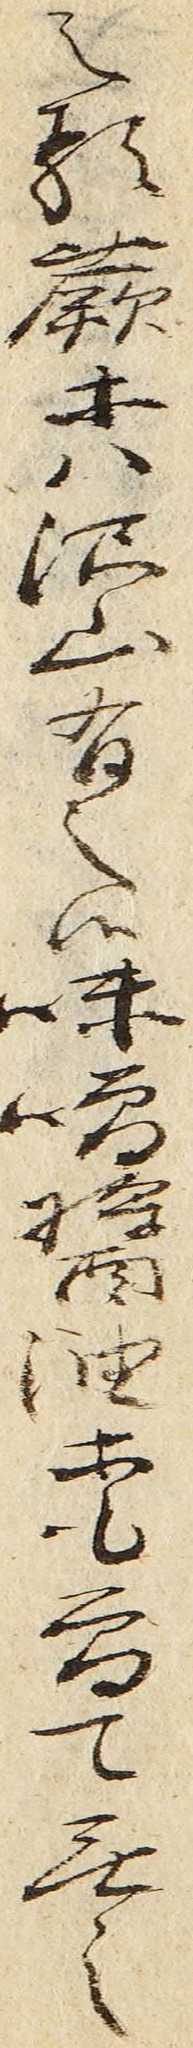之類蕨等は沢山有之候味噌醤油等も曽て無之
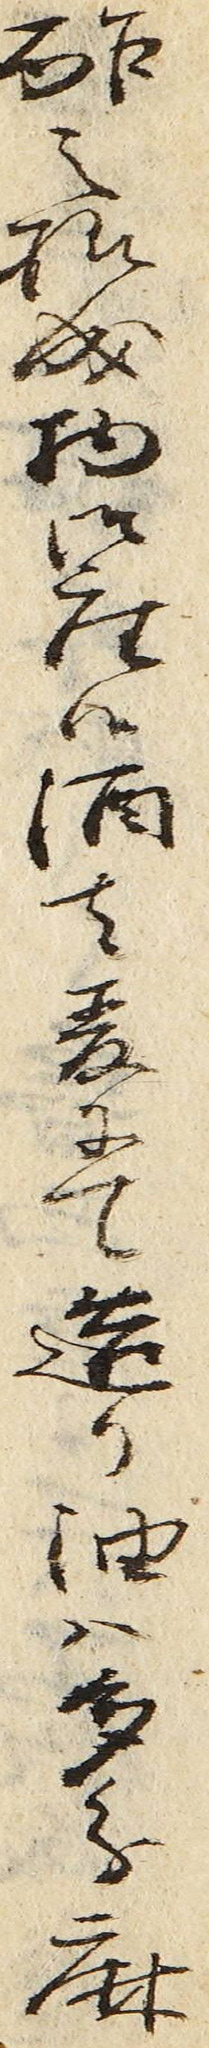酢之様成物御座候酒は麦にて造り油は多分麻
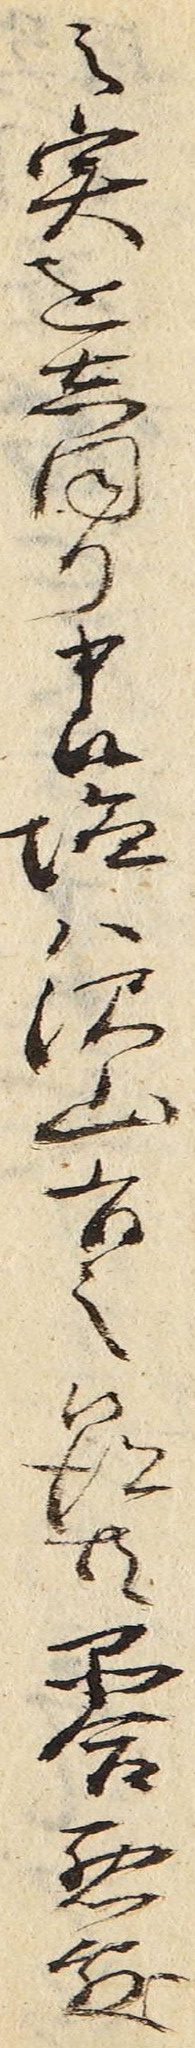之実をしほり申候塩は沢山有之候得共品合悪敷
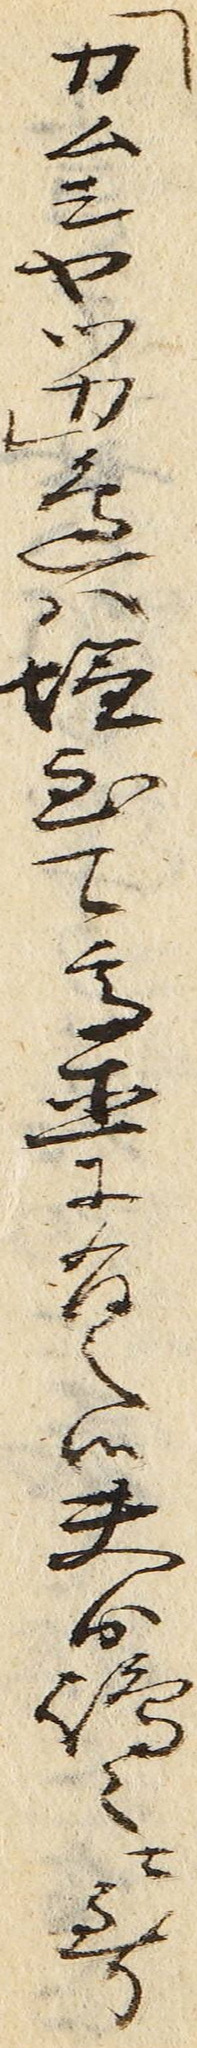「カムシヤツカ」辺は塩至て高直に有之候夫ゟ島々に至り
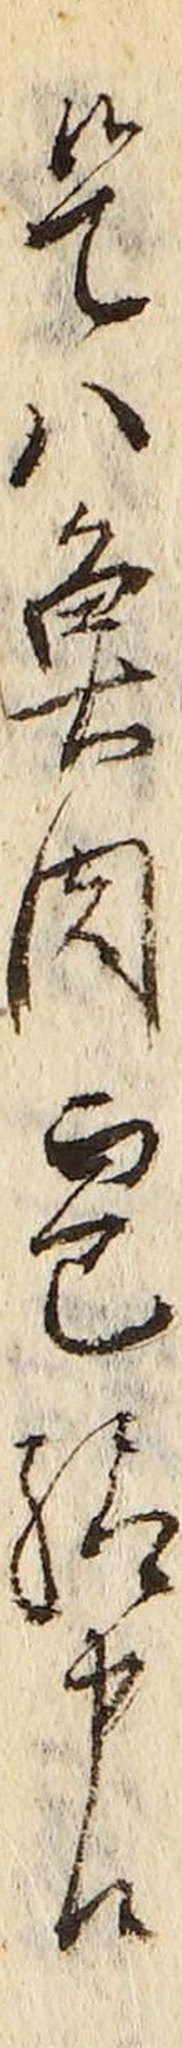候ては魚肉而已給申候
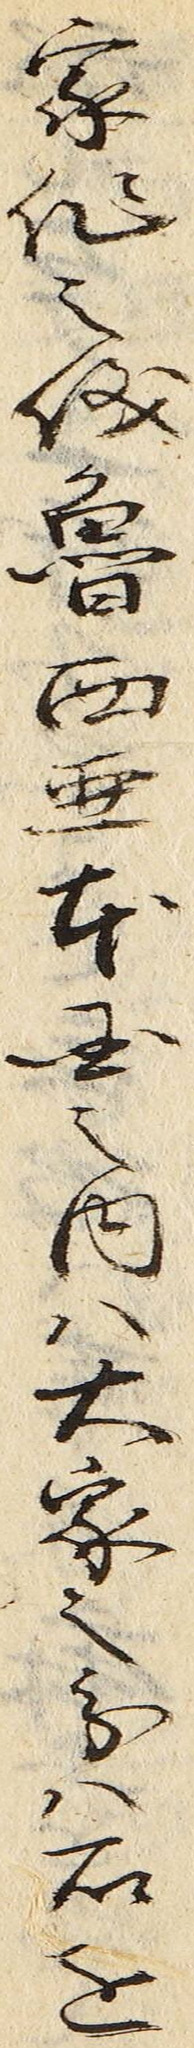家作之儀魯西亜本国之内は大家之分は石を
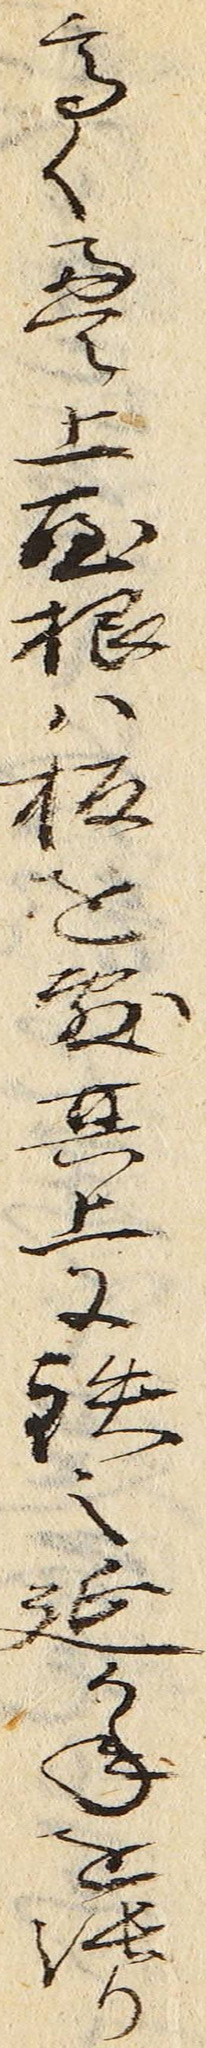高く畳上屋根は板を敷其上に鉄之延かねを張り
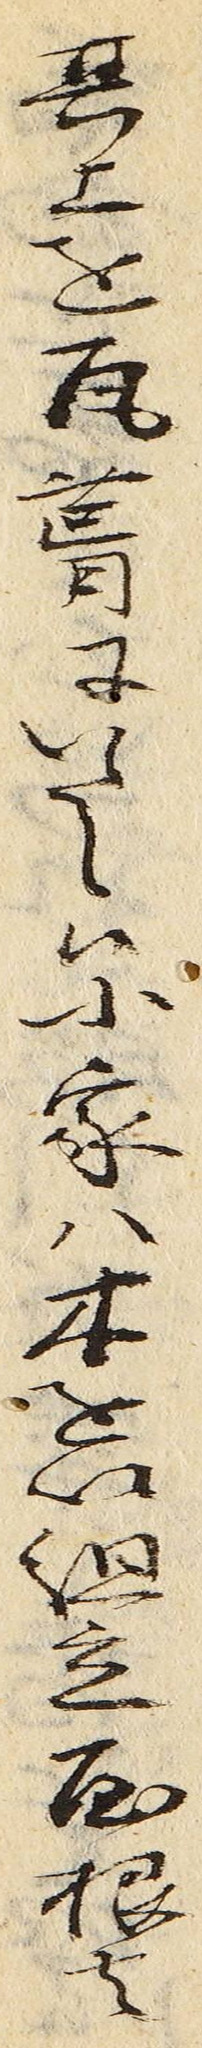其上を瓦葺にいたし候小家は木を以組立屋根は
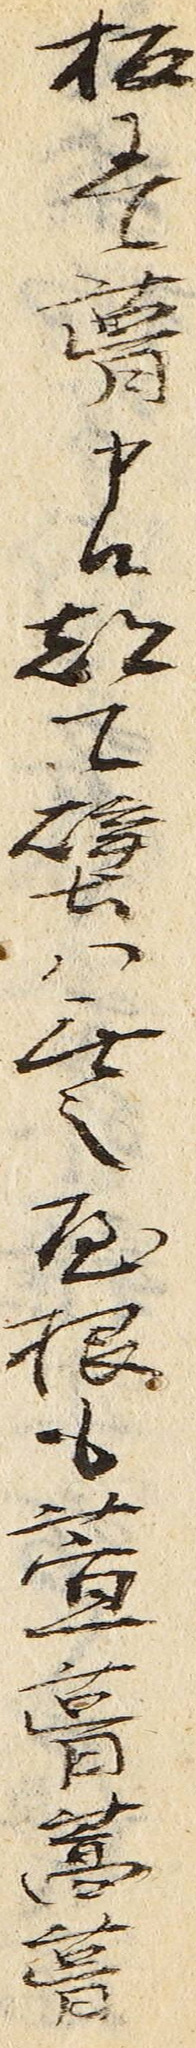板にて葺申候都て壁は無之屋根も萱葺藁葺
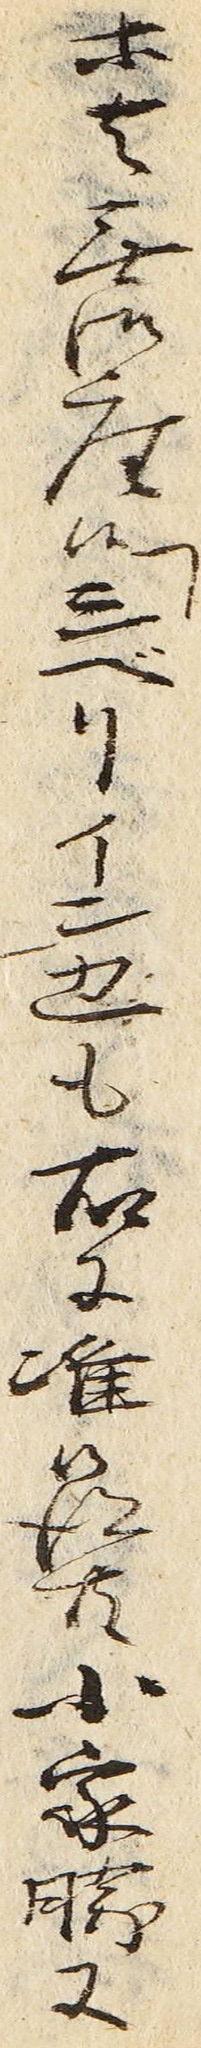等は無御座候「シベリイン」辺も右に准候得共小家勝に
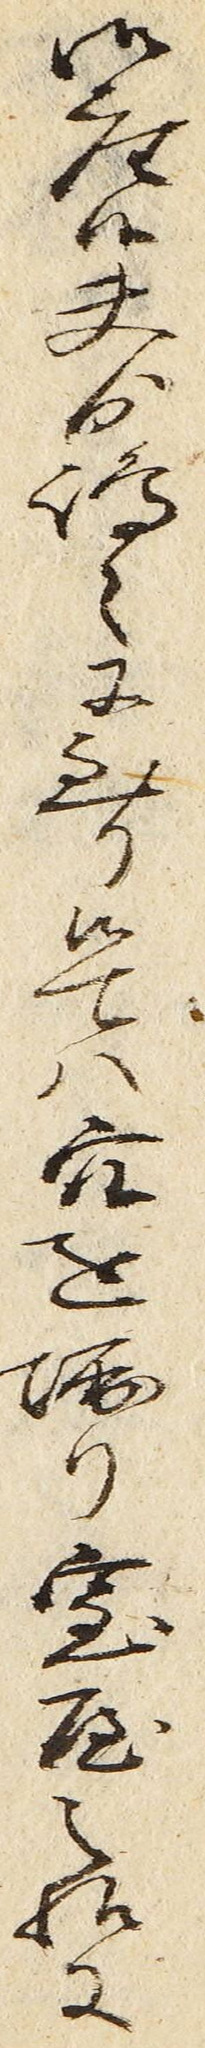御座候夫ゟ島々に至り候ては穴を掘り室屋の様に
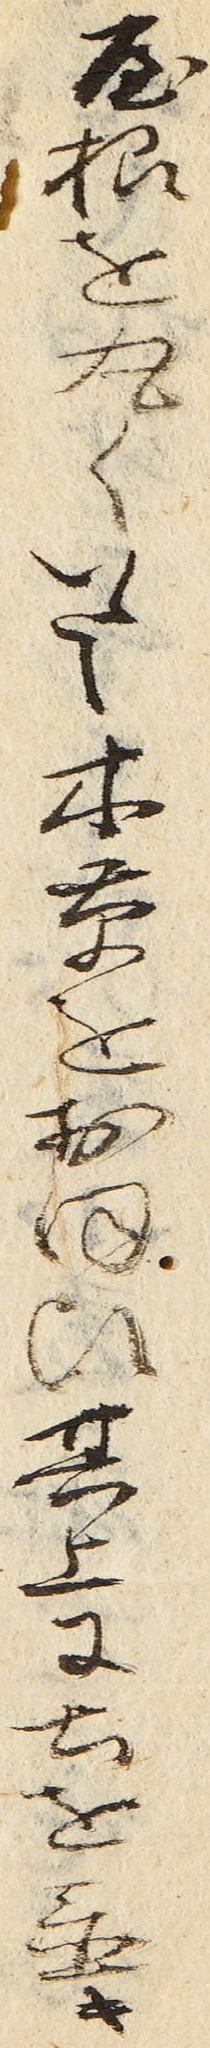屋根を丸くいたし木草をおほひその上に土を置キ
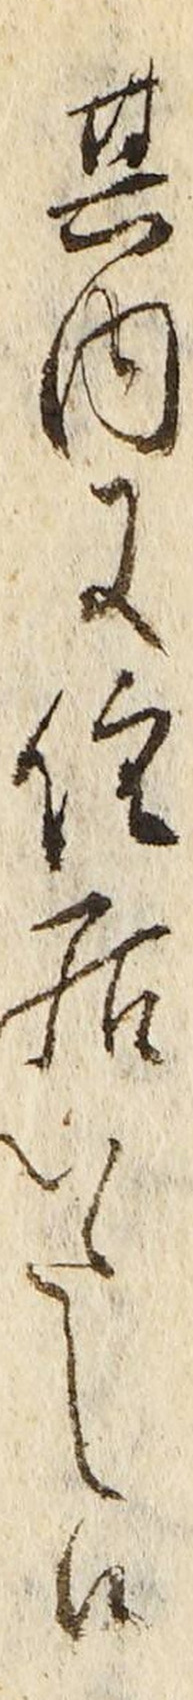其内に住居いたし候
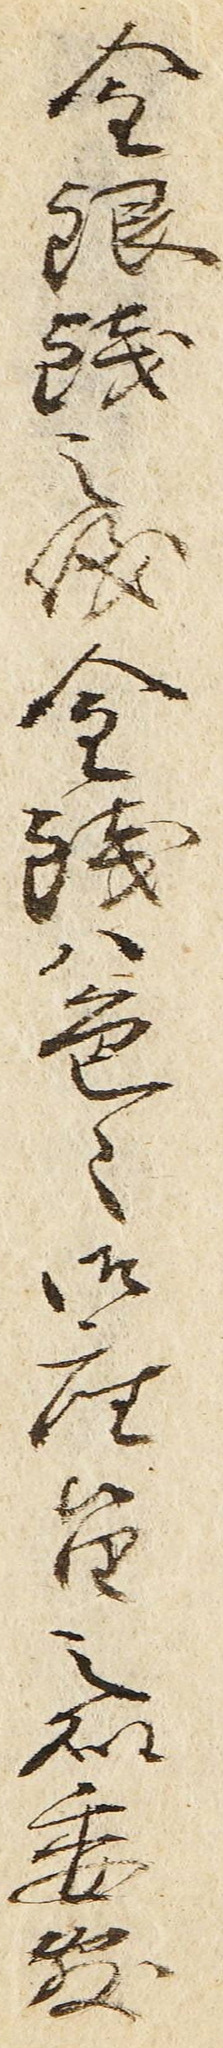金銀銭之儀金銭は色々御座候由之処委敷
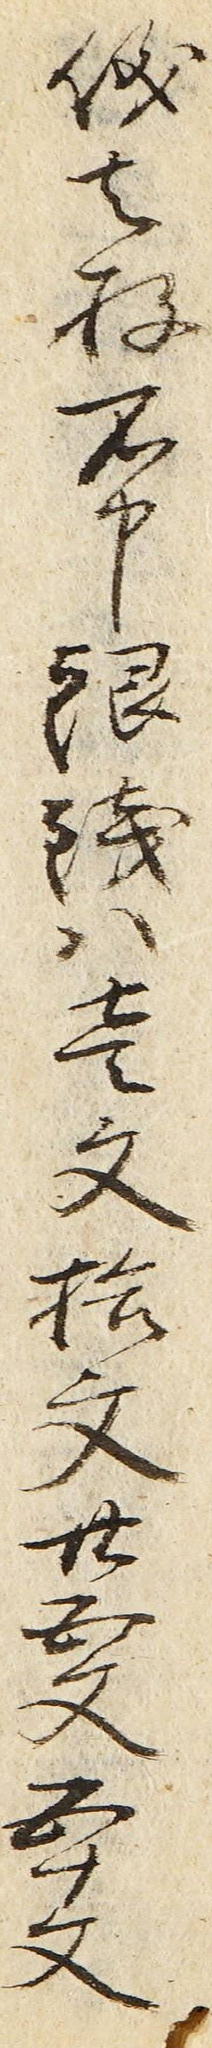儀は存不申銀銭は壱文拾文廿五文五十文
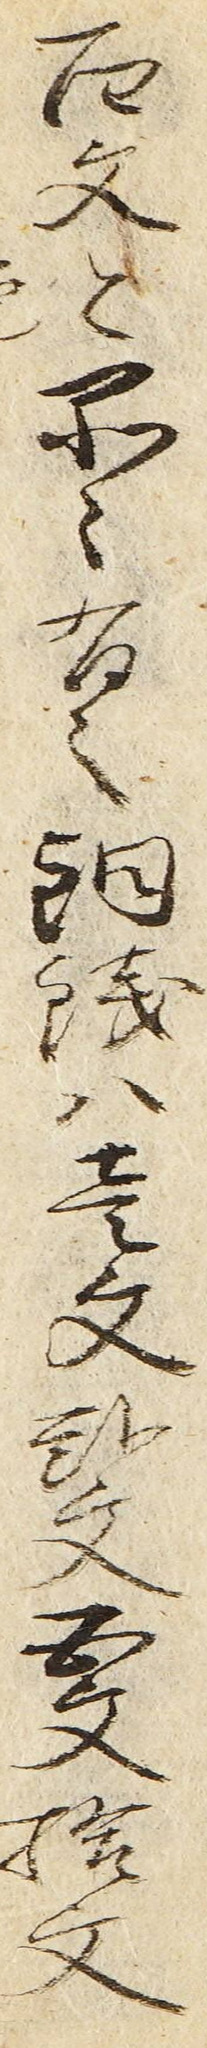百文と品々有之銅銭は壱文弐文五文拾文
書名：漂民後記
